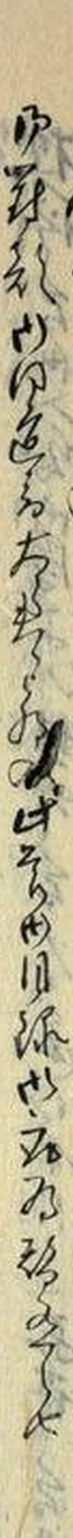御対顔後同道ニ而大奥へ被為入此節御目録御取為替有之由
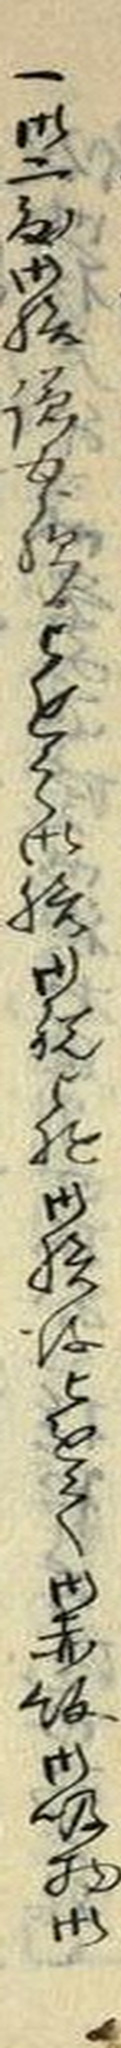一御二度御膳謙五郎様ゟ被進之御膳御祝被遊御膳後被進之御赤飯御吸物御
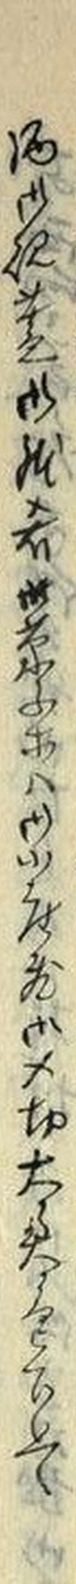酒御硯蓋御鉢肴御菓子等ハ御小座敷御〆切大奥ニ而被召上候
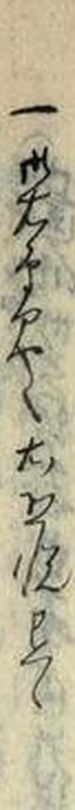一御右筆部やへ右恐悦申上候
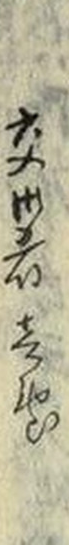交御肴壱台
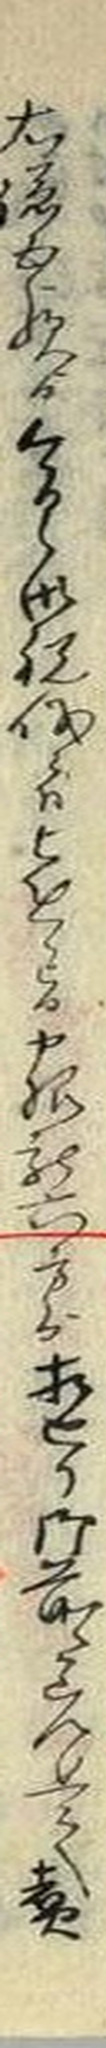右謙五郎様ゟ今日之御祝儀ニ付被進候旨中根新六方ゟ相廻り御前へ差上之煮
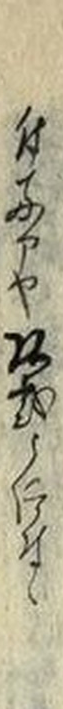付両部や頂戴被仰付候
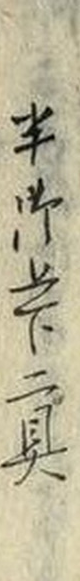半御上下二具
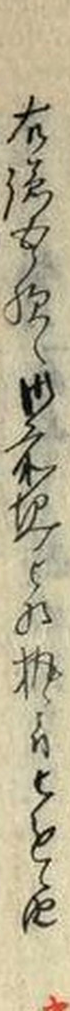右謙五郎様へ御前髪被為執候ニ付被進候由
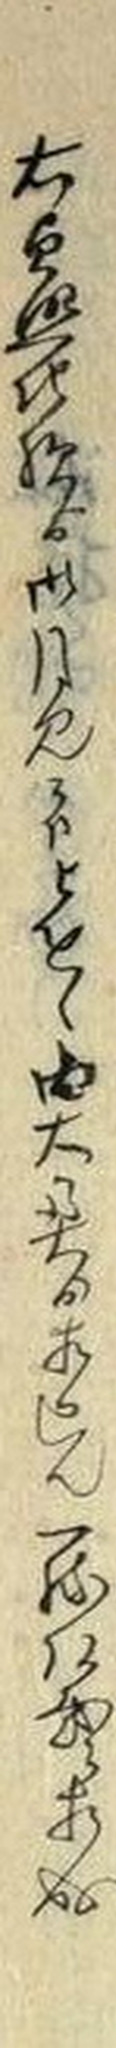右貞照院様ゟ御月見ニ付被進候由大奥ゟ相廻ル一統頂戴ニ相成

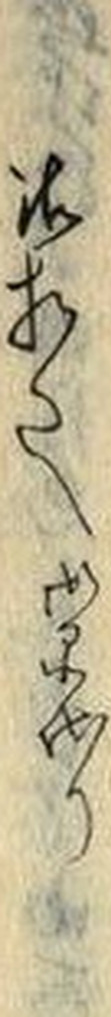銀拾匁御品代り
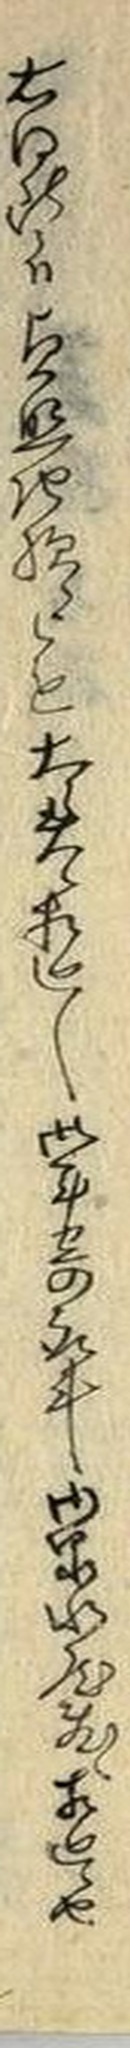右同断ニ付貞照院様へ被進大奥へ相廻し御年寄取計御泉水屋敷へ相廻候由
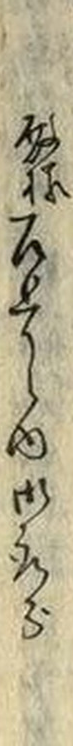殿様召上り之内御取分
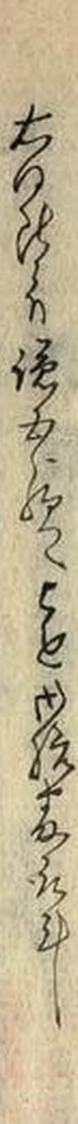右同断ニ付謙五郎様へ被進御膳番取計
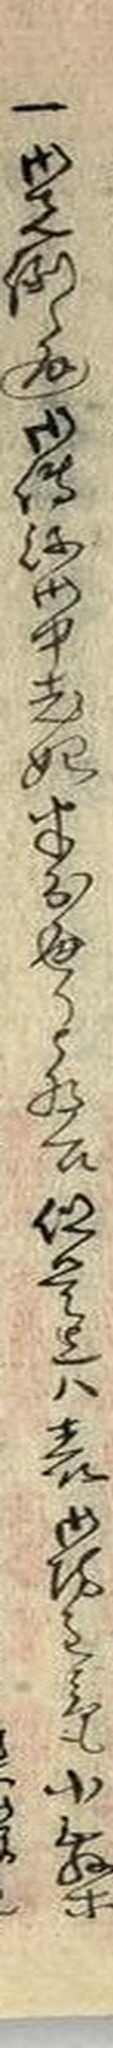一御先例之通御傅役御中老始半分通り被為召但是迄ハ表御坊主ニ而も小舞等
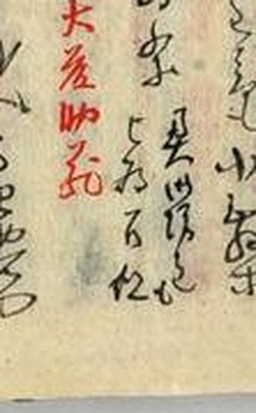被為召但
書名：少傅日録抄（斉承付側向頭取日記、在国）
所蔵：福井県文書館 Fukui Prefectural Archives
